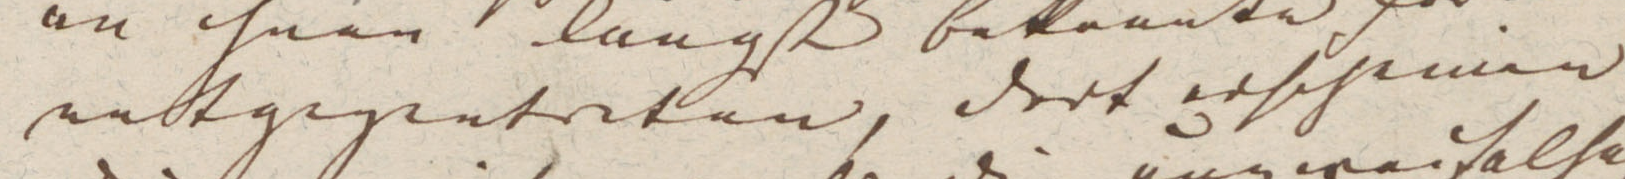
entgegentreten, dort erscheinen
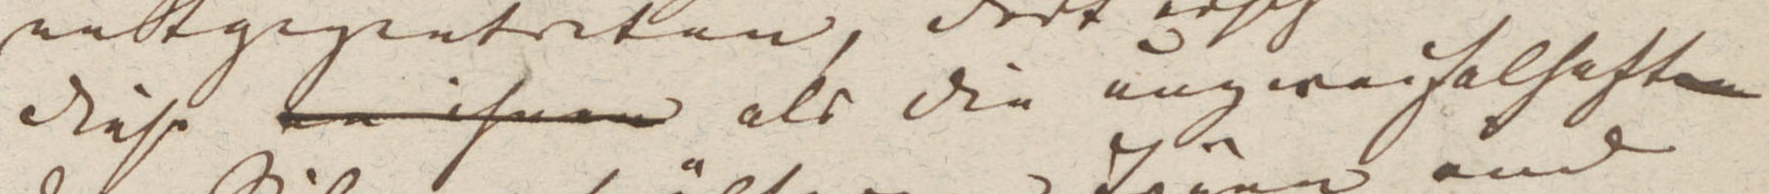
diese an ihnen als die unzweifelhaften
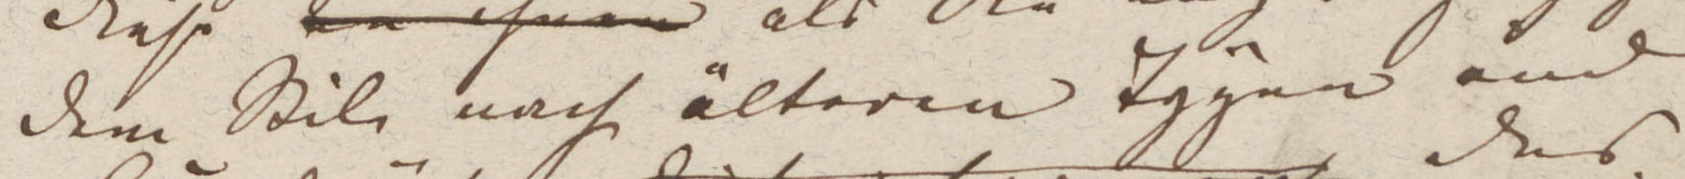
dem Stile nach älteren Typen und
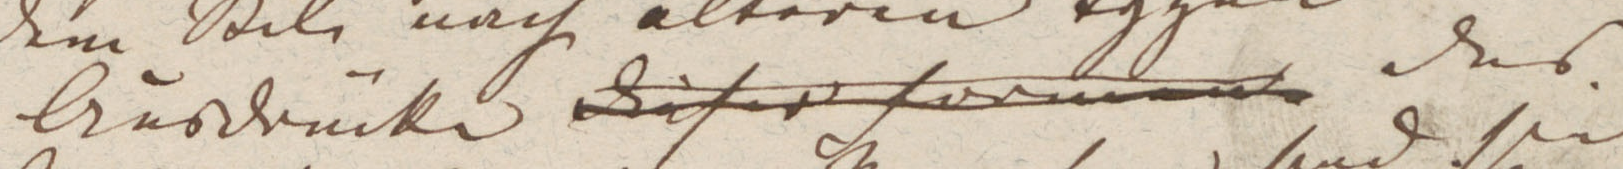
Ausdrücke dieser Formen des
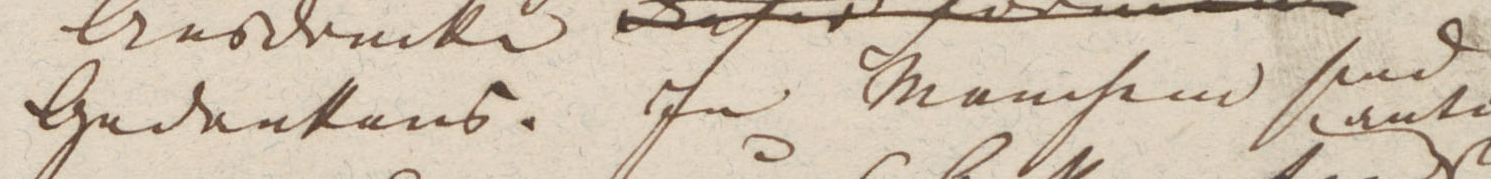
Gedankens. In Manchem sind
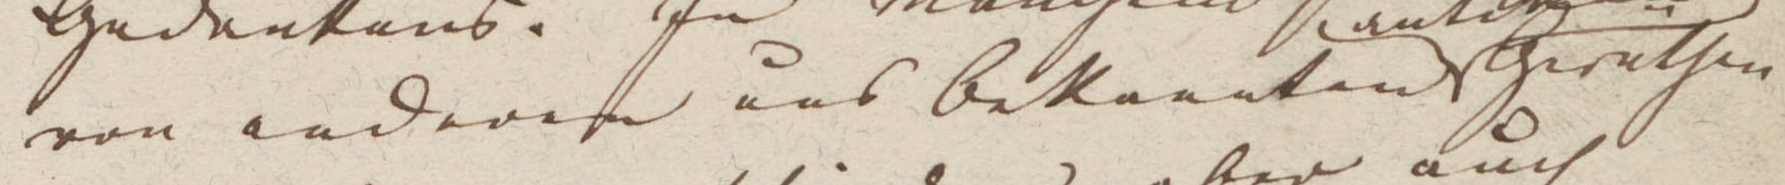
von anderen uns bekannten antiken Geräthen
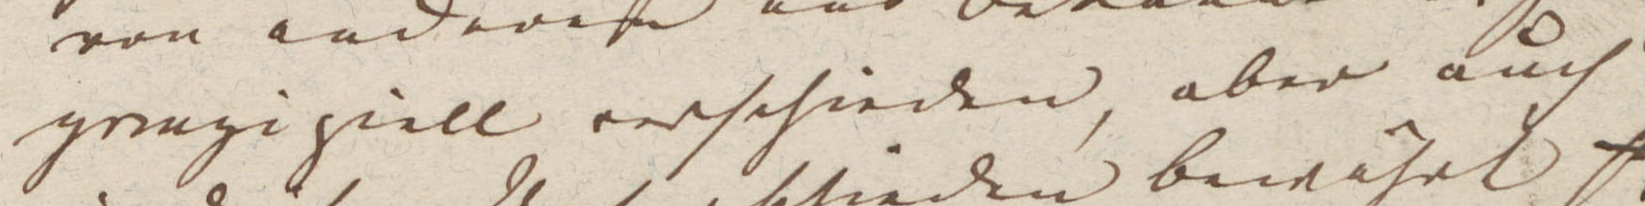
prinzipiell verschieden, aber auch
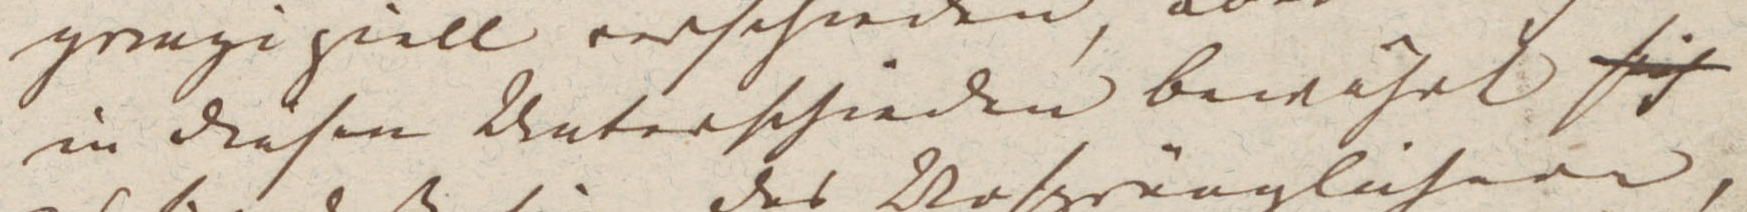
in diesen Unterschieden bewährt sich
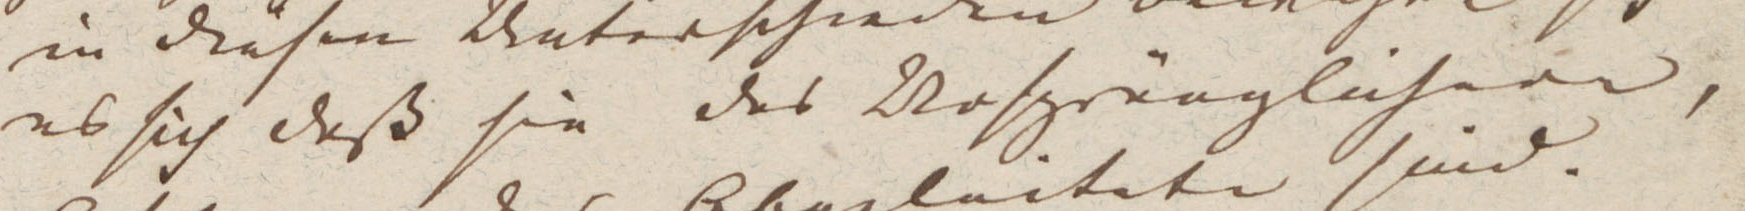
es sich dass sie das Ursprünglichere,
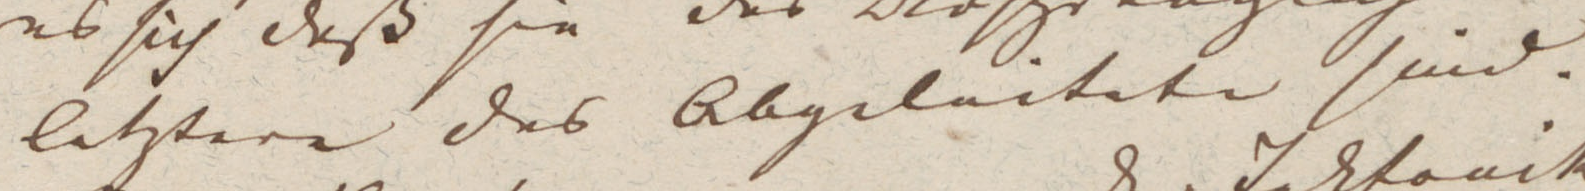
letztere das Abgeleitete sind.
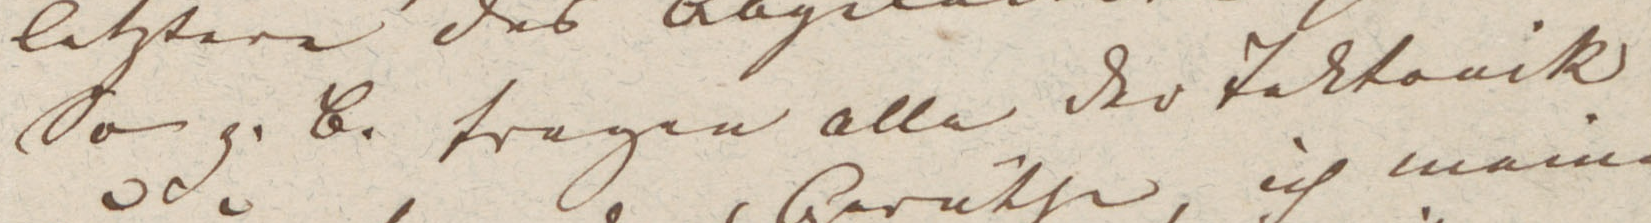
So z. B. tragen alle der Tektonik
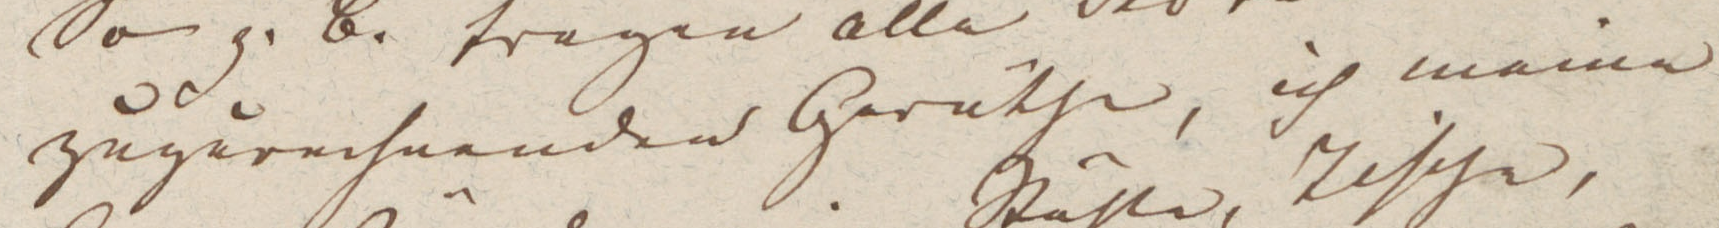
zuzurechnenden Geräthe, ich meine
